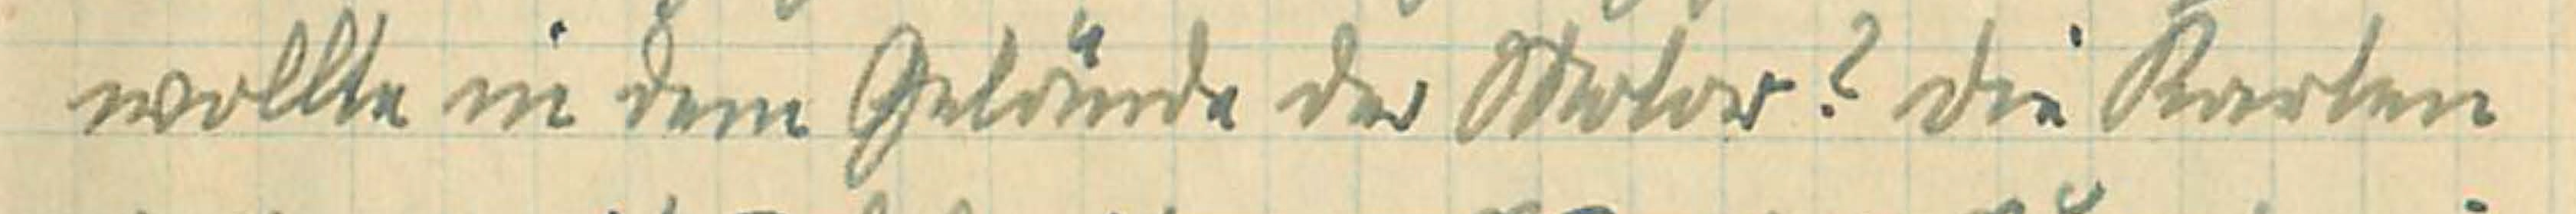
wollte in dem Gelände der Motor? Die Karten
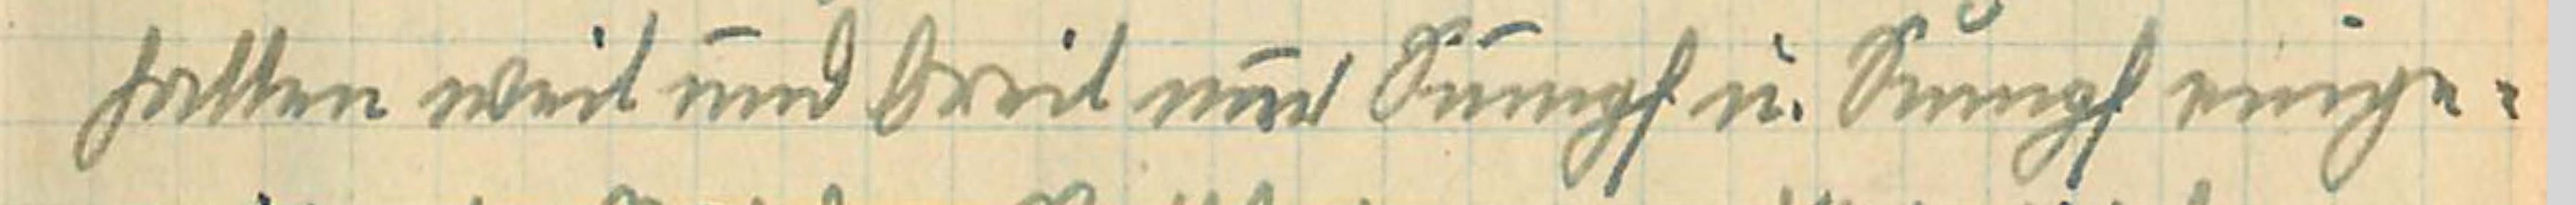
hatten weit und breit nur Sumpf u. Sumpf einge-
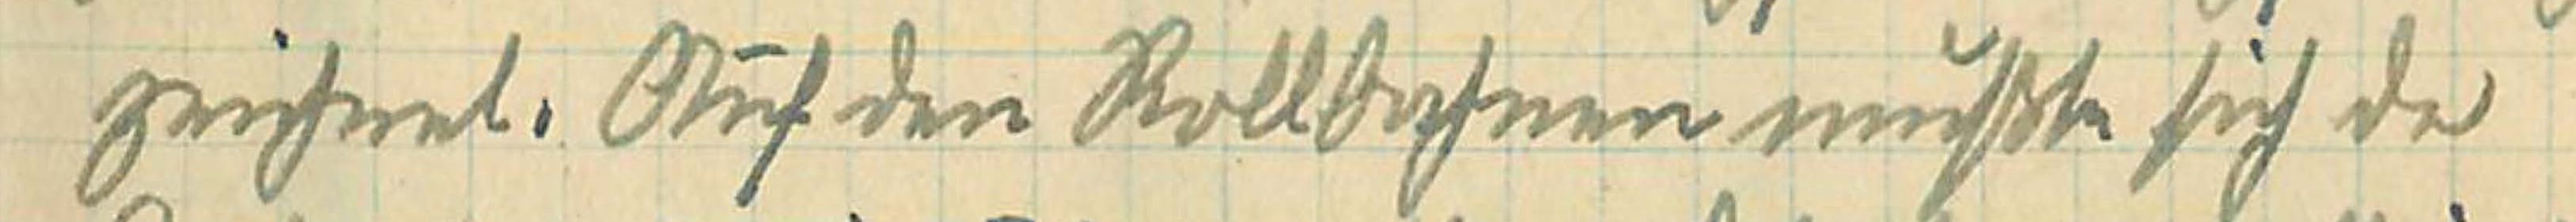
zeichnet. Auf den Rollbahnen mußte sich der
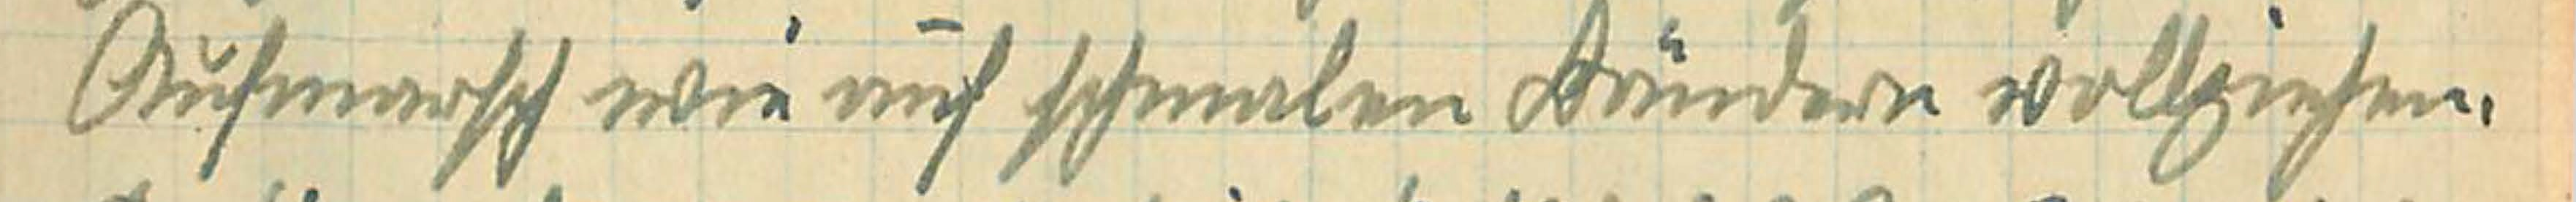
Aufmarsch wie auf schmalen Bändern vollziehen.
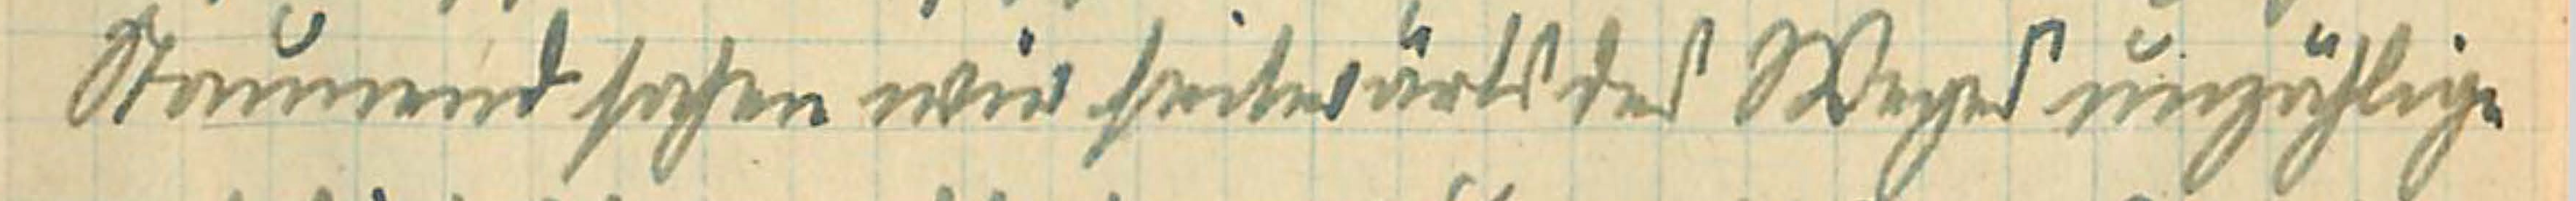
Staunend sahen wir seitwärts des Weges unzählige
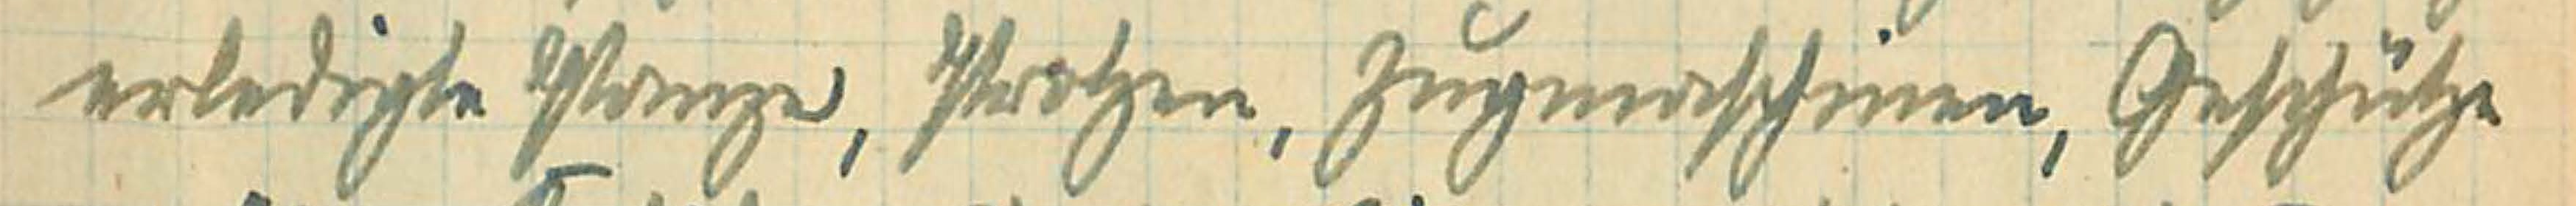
erledigte Panzer, Protzen, Zugmaschinen, Geschütze
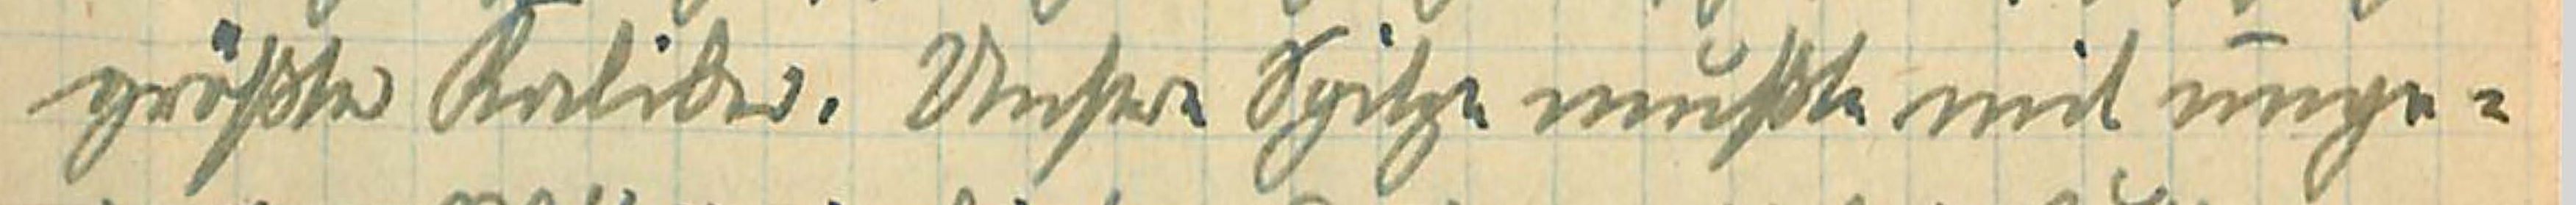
größter Kaliber. Unsere Spitze mußte mit unge-
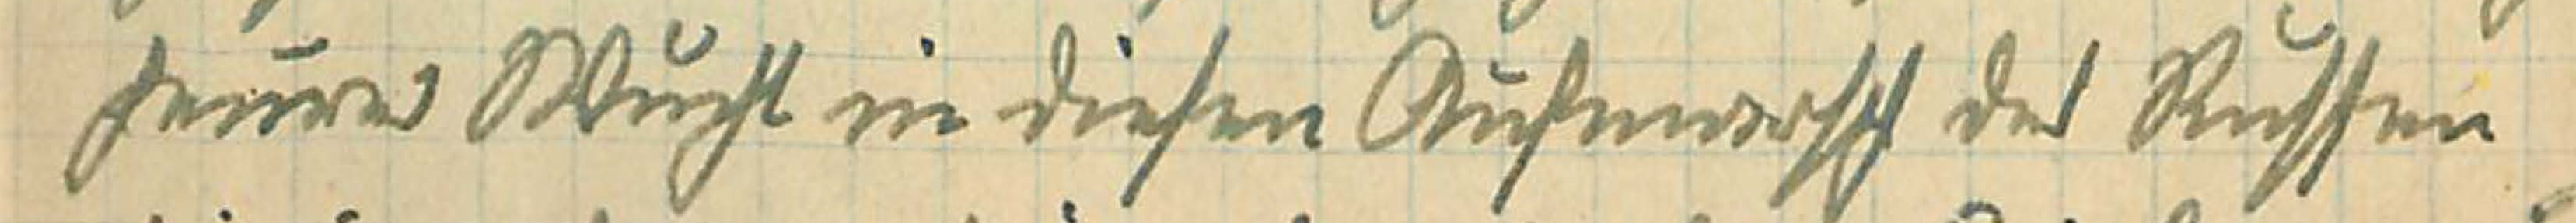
heurer Wucht in diesen Aufmarsch der Russen
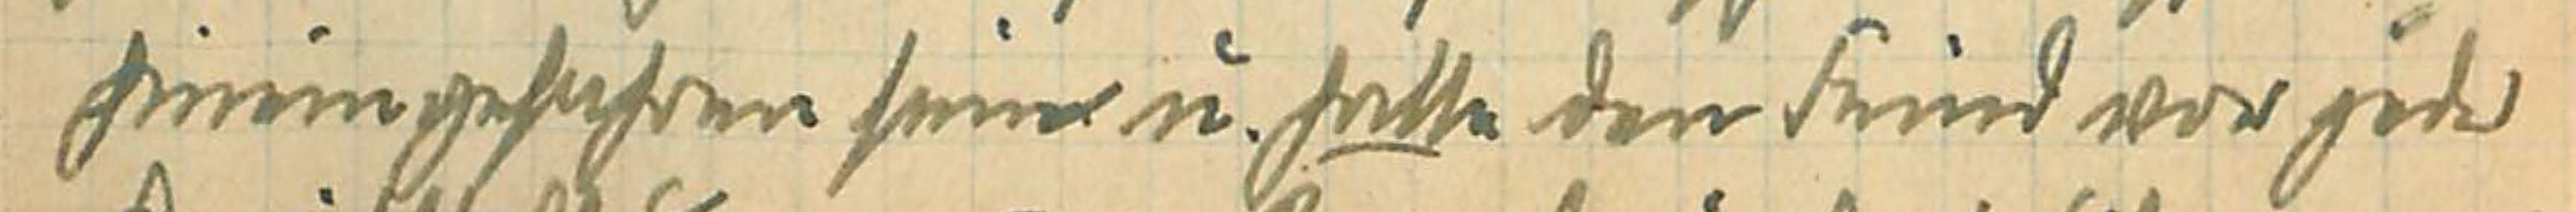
hineingefahren sein u. hatte den Feind vor jeder
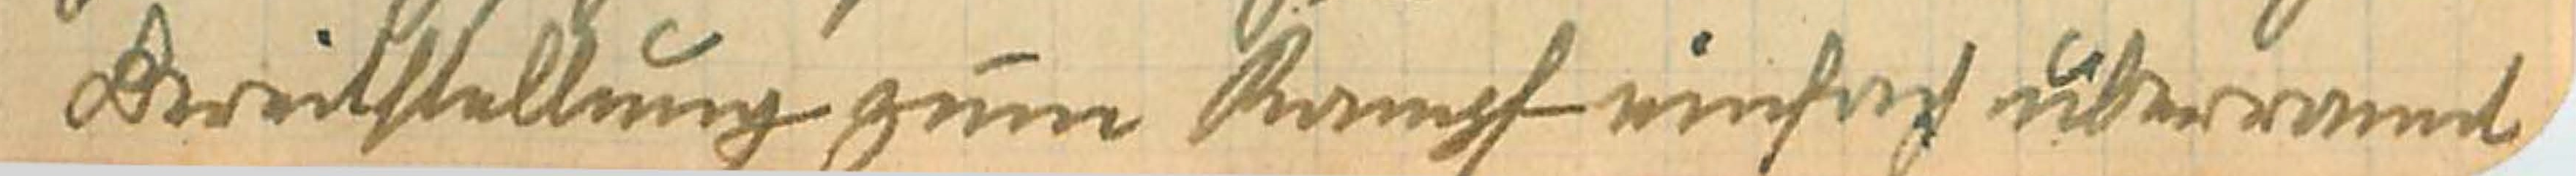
Bereitstellung zum Kampf einfach überrannt.
